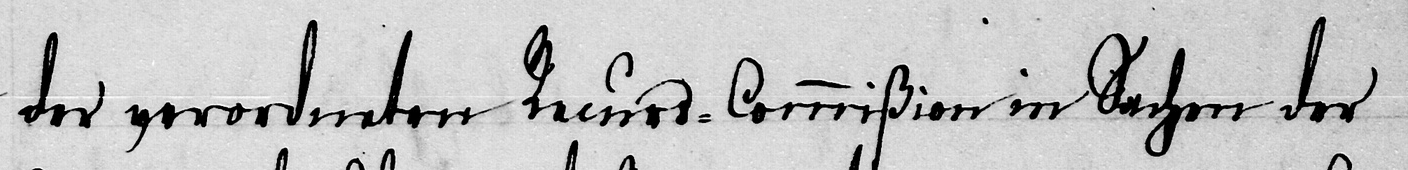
der verordneten Recurs-Commißion in Sachen der
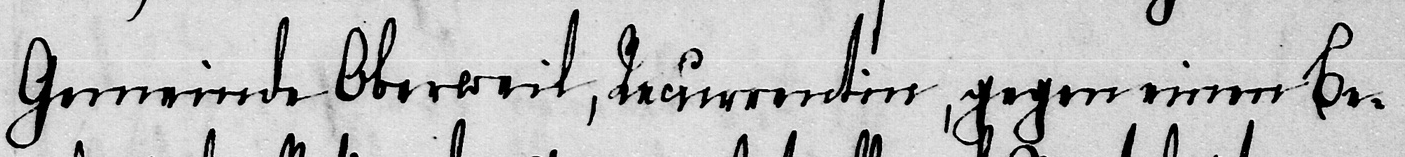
Gemeinde Oberweil, Recurrentin, gegen einen Bes¬
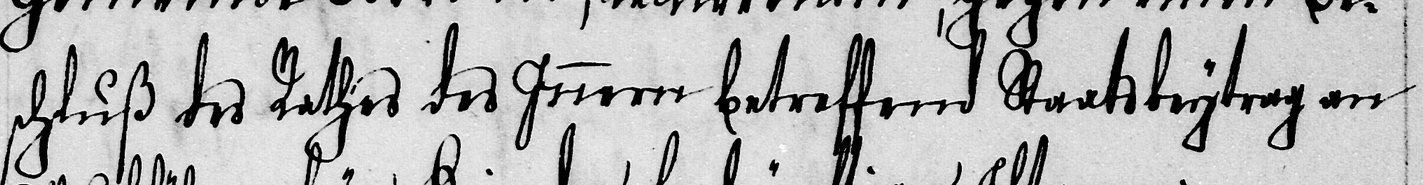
chluß des Rathes des Innern betreffend Staatsbeytrag an
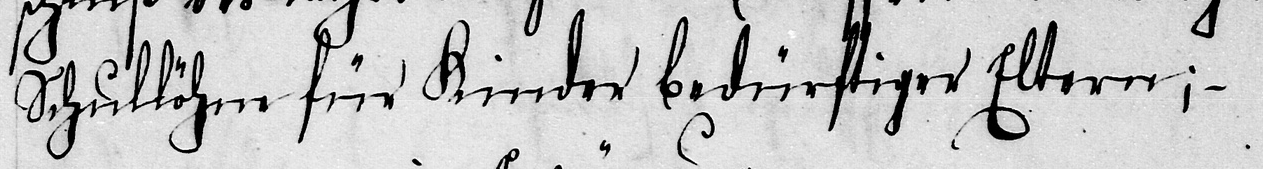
Schullöhne für Kinder bedürftiger Eltern;
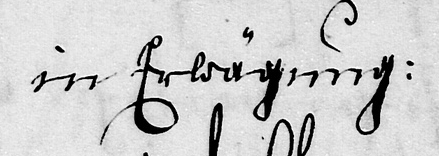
in Erwägung:
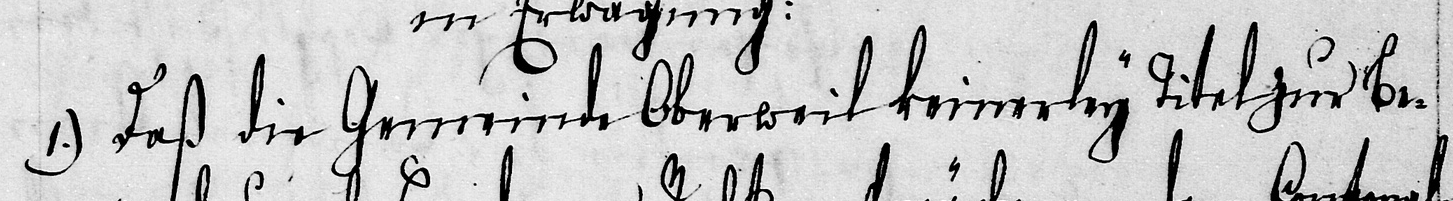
1.) Daß die Gemeinde Oberweil keinerley Titel zur Be¬
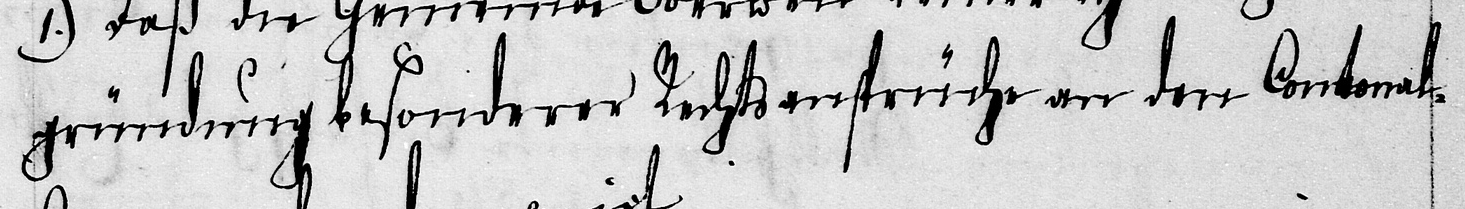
gründung besonderer Rechtsansprüche an den Cantona¬
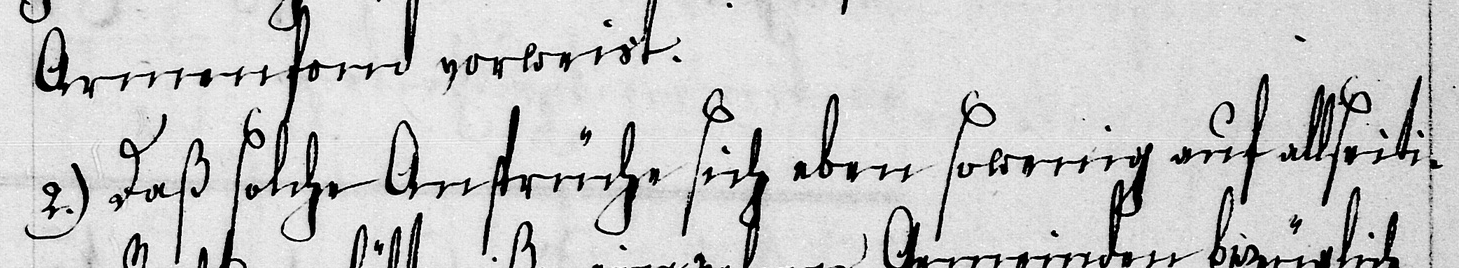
2.) Daß solche Ansprüche sich eben sowenig auf allsei¬
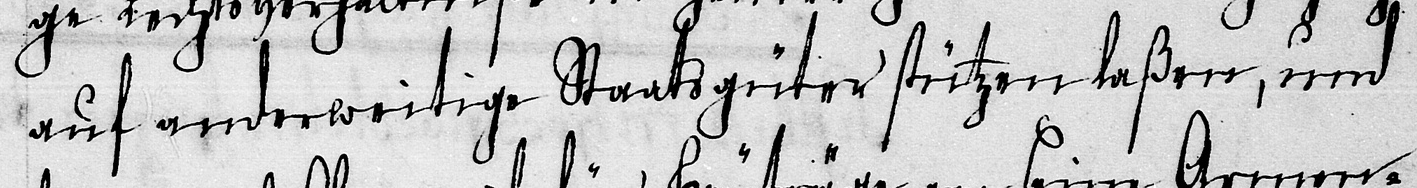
auf anderweitige Staatsgüter stützen laßen, und
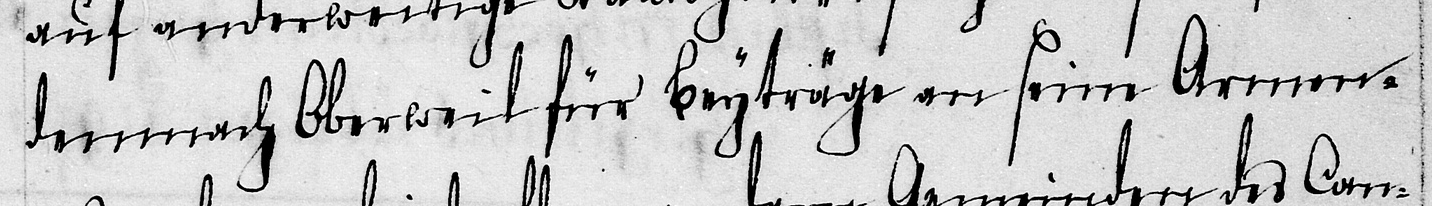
demnach Oberweil für Beyträge an seine Armen¬
